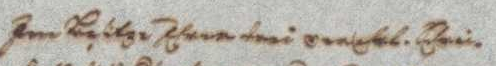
Im Besitze Ihrer drei verehrl. Schrei-
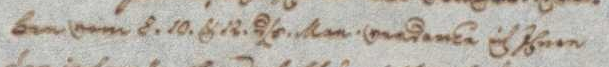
ben vom 8.10. & 12. dss. Mon. verdanke ich Ihnen
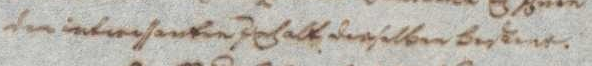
den interessanten Inhalt derselben bestens.
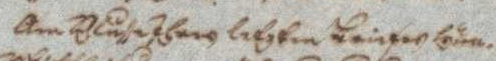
Am Schlusse Ihres letzten Briefes wün-
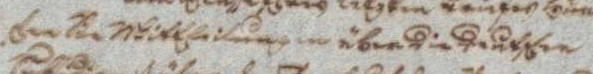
schen Sie Mittheilungen über die deutschen
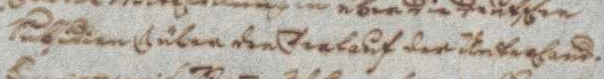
Subsidien & über den Verlauf der Unterhand-
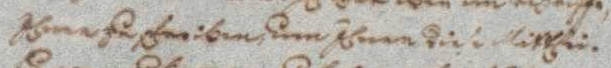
Ihnen zu schreiben, um Ihnen diese Mitthei-
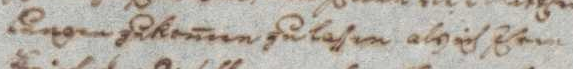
lungen zukommen zu lassen, als ich Ihren
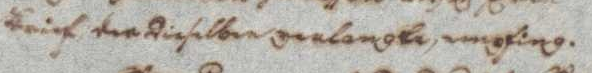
Brief, der dieselben verlangte, empfing.
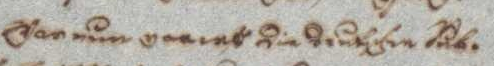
Was nun vorerst die deutschen Sub-
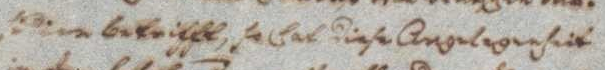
sidien betrifft, so hat diese Angelegenheit
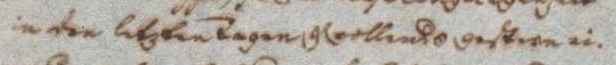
in den letzten Tagen & vollends gestern ei-
